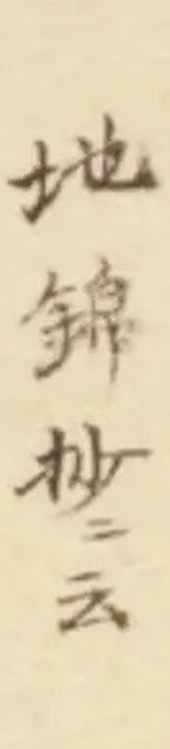地錦抄に云
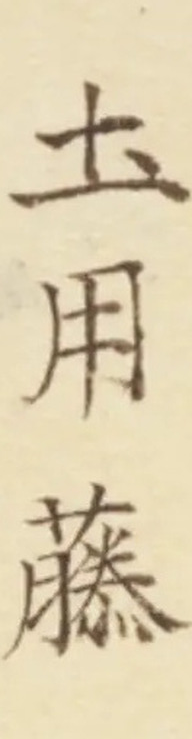土用藤

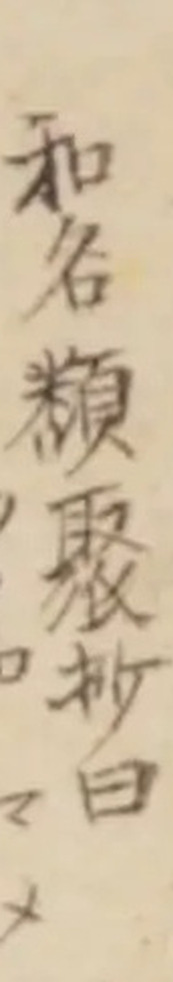和名類聚抄曰
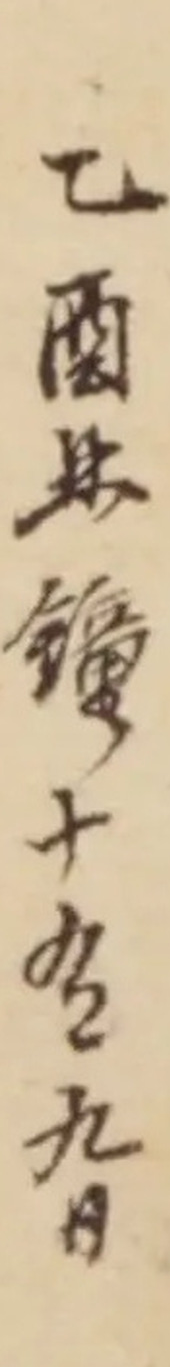乙酉林鐘十有九日
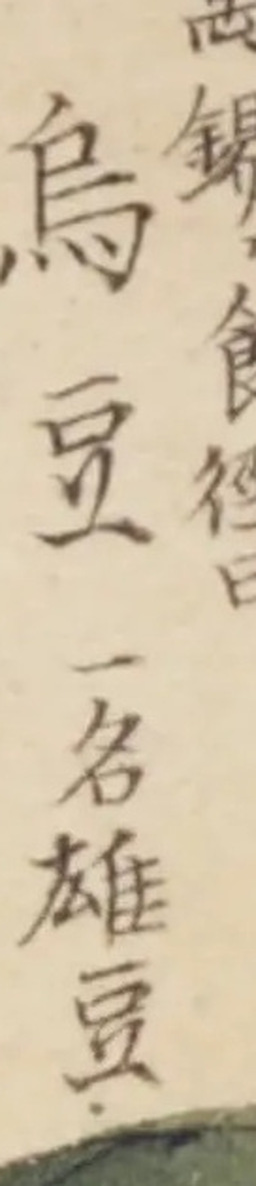烏豆一名雄豆
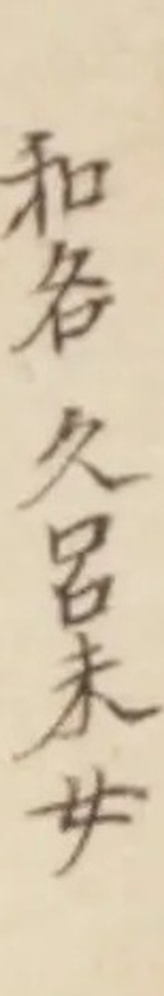和名久呂未女
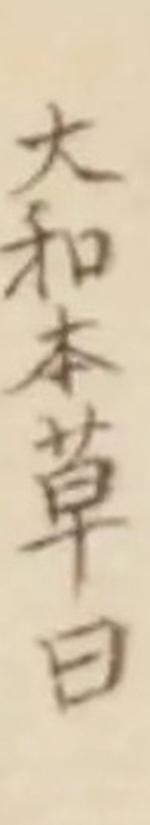大和本草曰
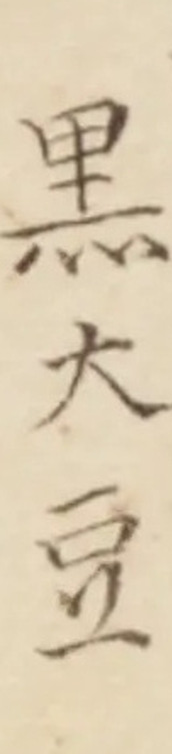黒大豆
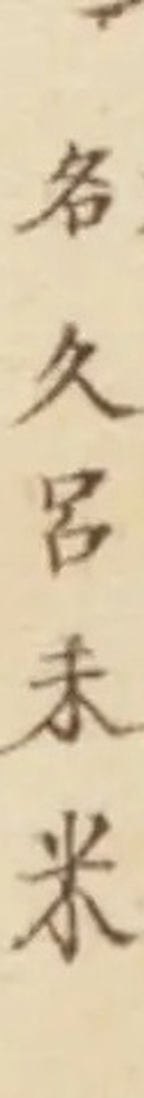名久呂未来
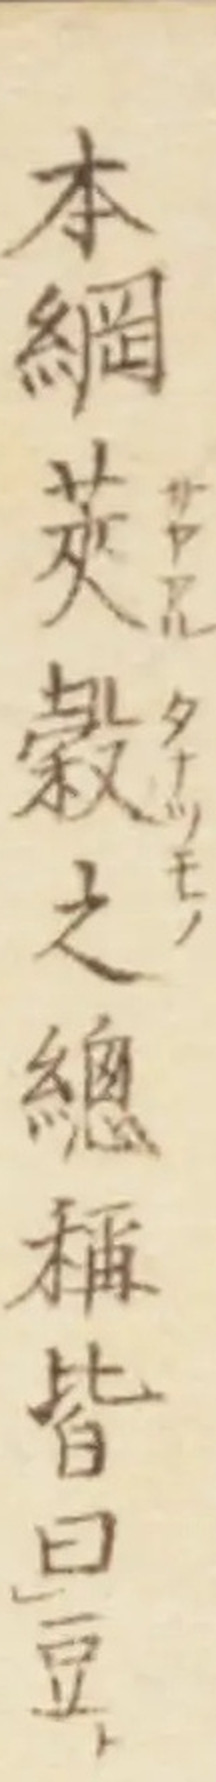本綱莢穀之總稱皆曰豆と
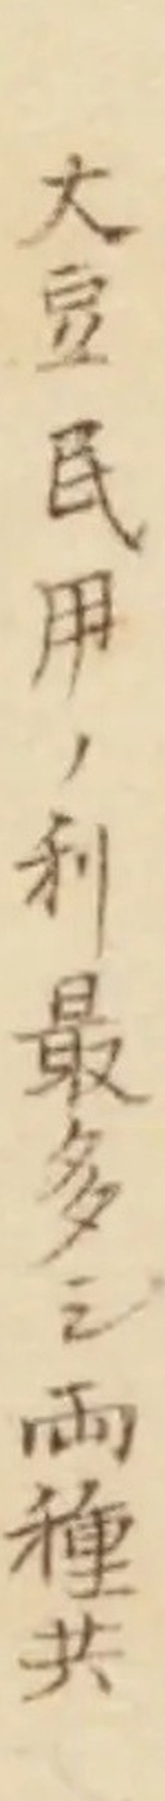大豆民用の利最多し両種共
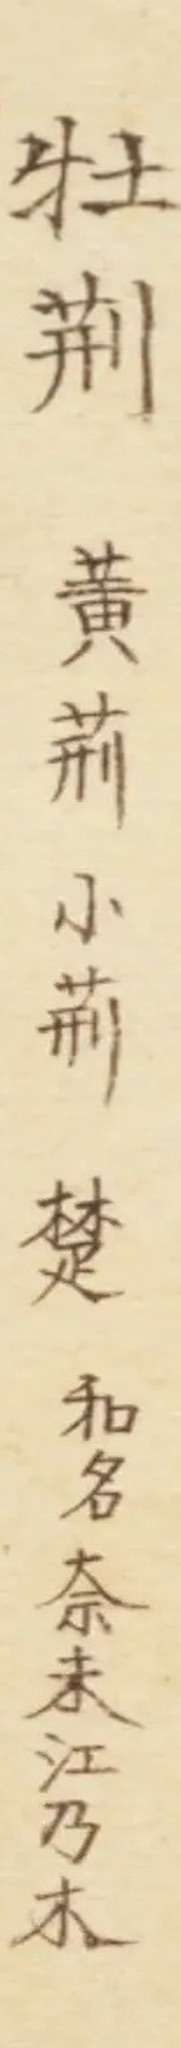牡荊黄荊小荊楚和名奈未江乃木
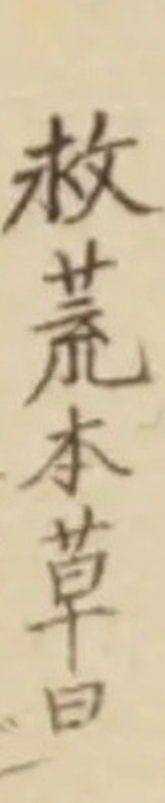救荒本草曰
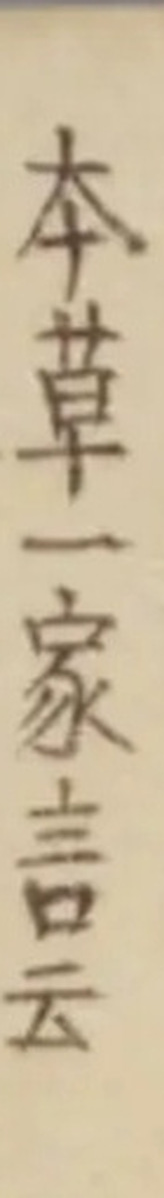本草一家言云
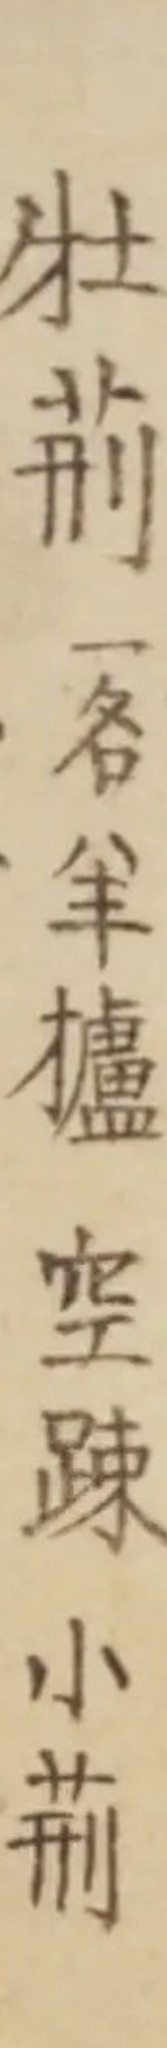牡荊一名羊櫨空踈小荊
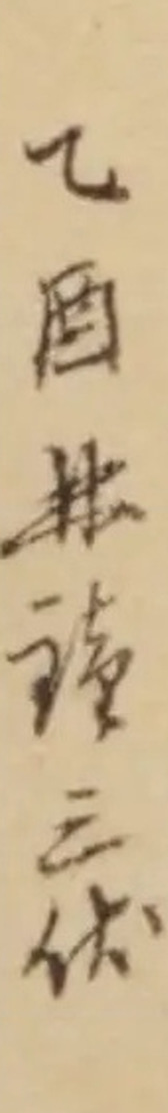乙酉林鐘三伏
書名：梅園草木花譜夏之部. 3
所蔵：国立国会図書館 National Diet Library, JAPAN
